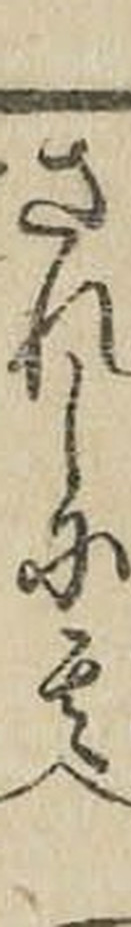されしに其
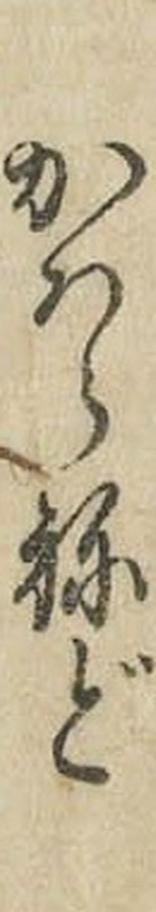かはらねど
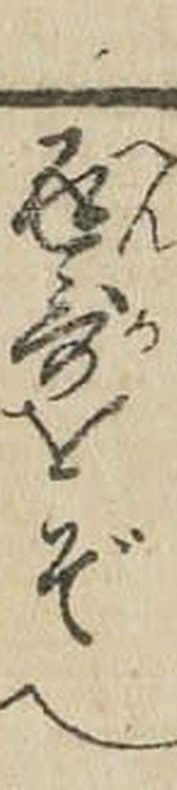返歌をぞ
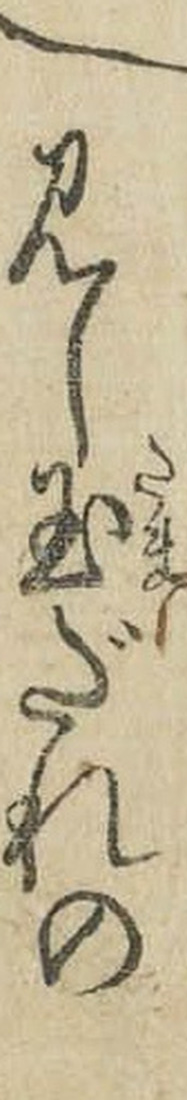みし玉だれの
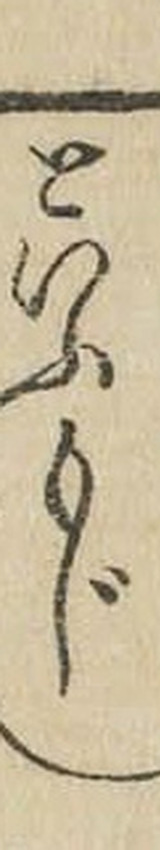といふもじ
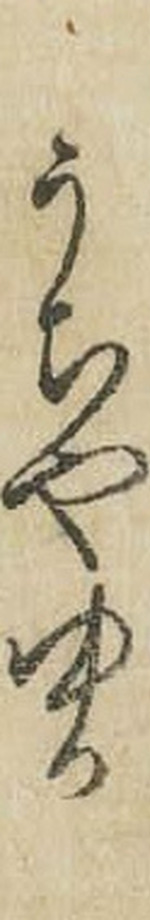うちやゆか
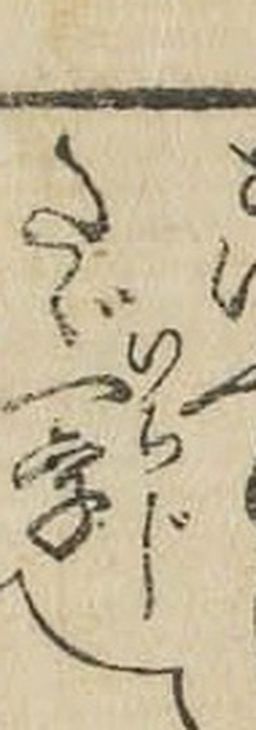たゞ一字
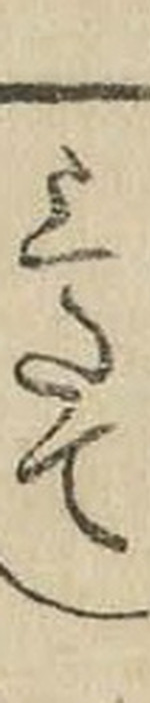上たて
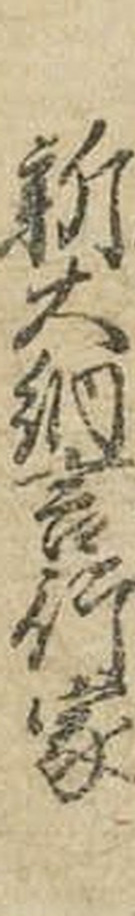新大納言行家
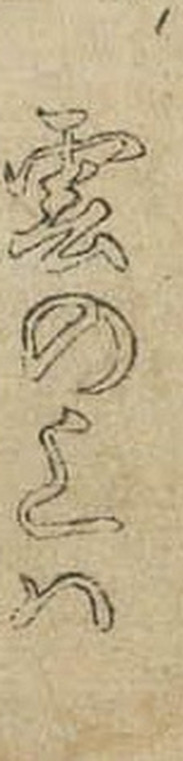雲の上は
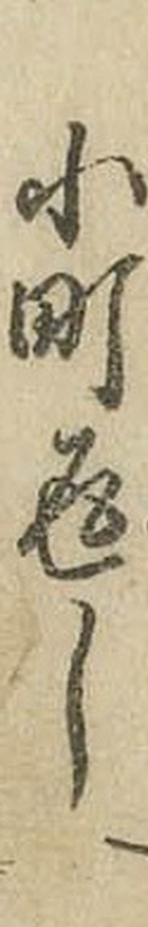小町返し
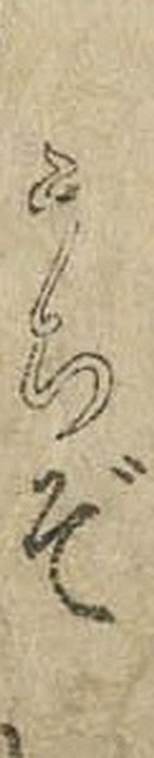うちぞ

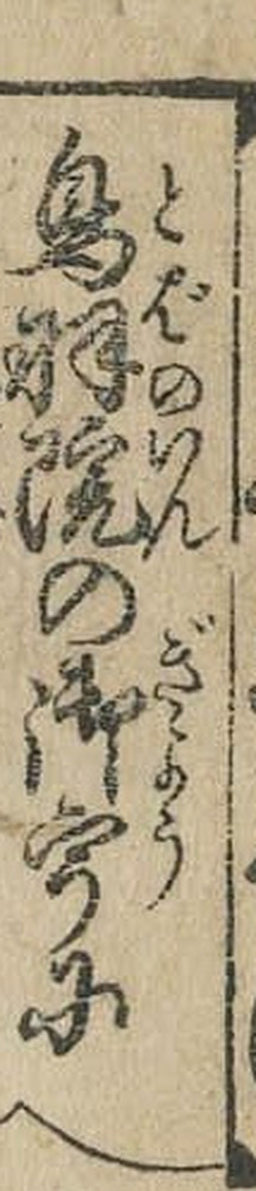鳥羽院の御宇に
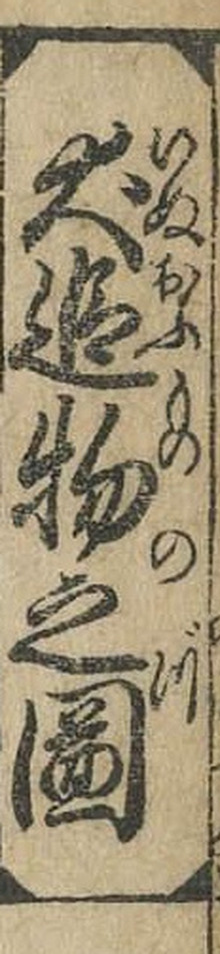犬追物之図
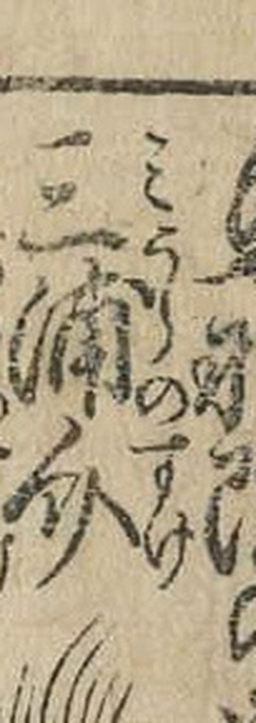三浦介
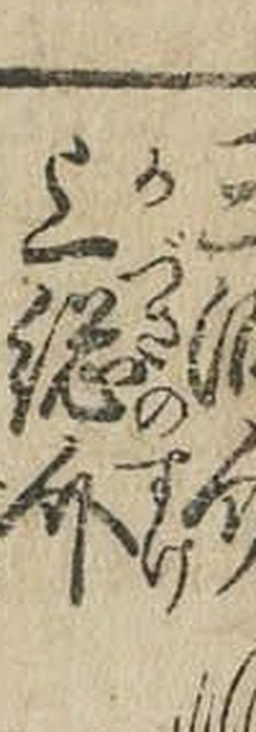上総介
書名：絵本写宝袋 9巻 1之巻
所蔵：東京学芸大学教育コンテンツアーカイブ
